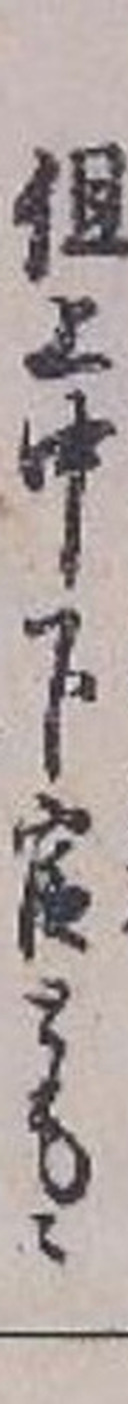但上中下官ともに
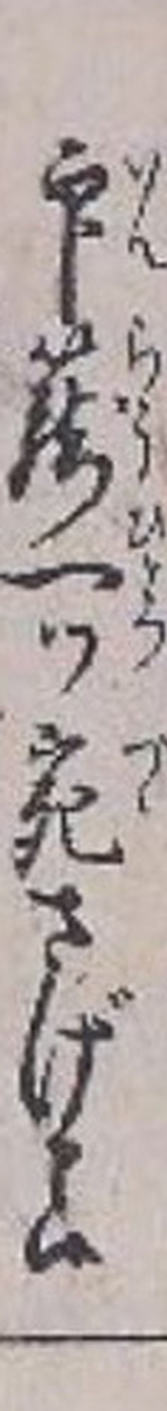印籠一つ宛さげ申候
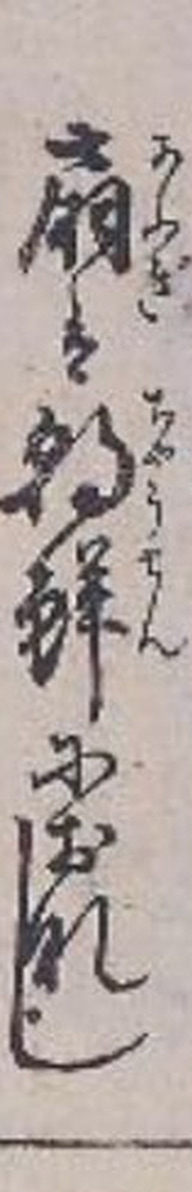扇は朝鮮におなじ
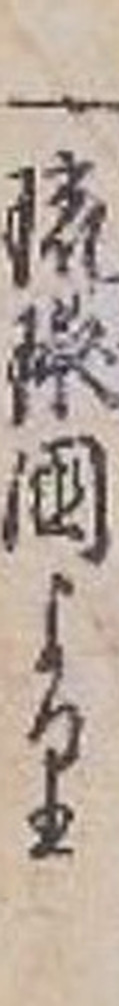琉球国より
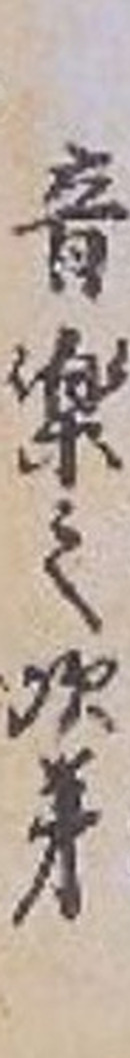音楽之次第
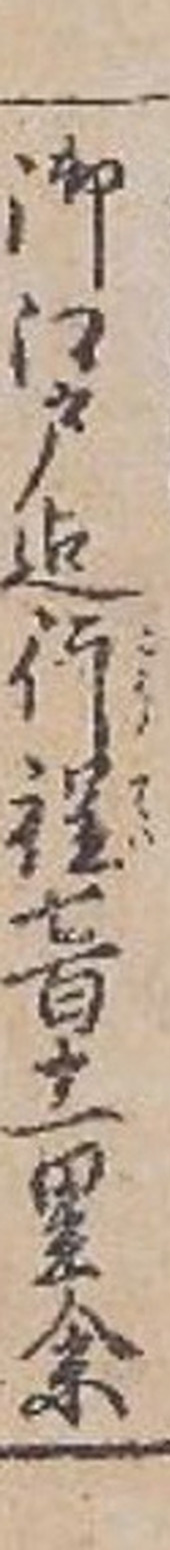御江戸迄行程七百十一里余
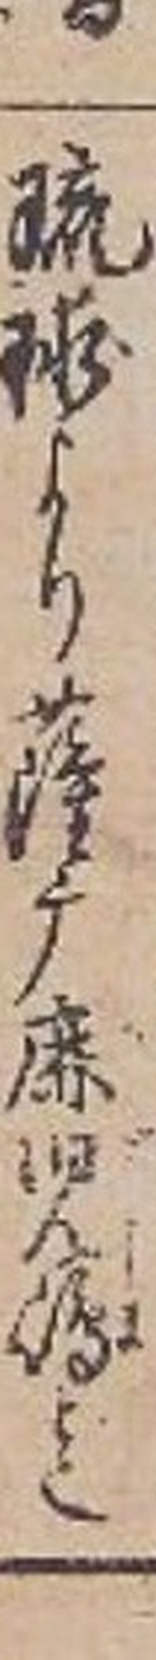琉球より薩摩鹿児嶋迄
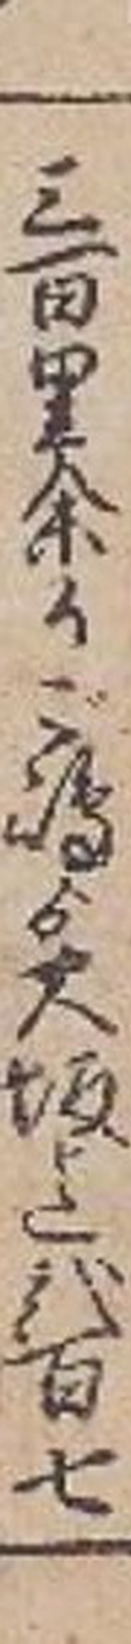三百里余かご嶋より大坂迄弐百七
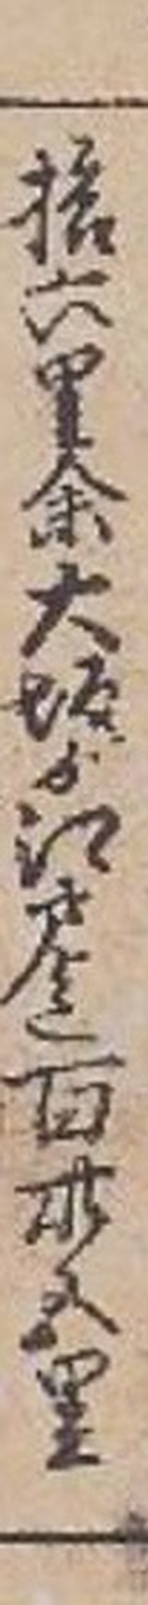拾六里余大坂より江戸迄百丗五里
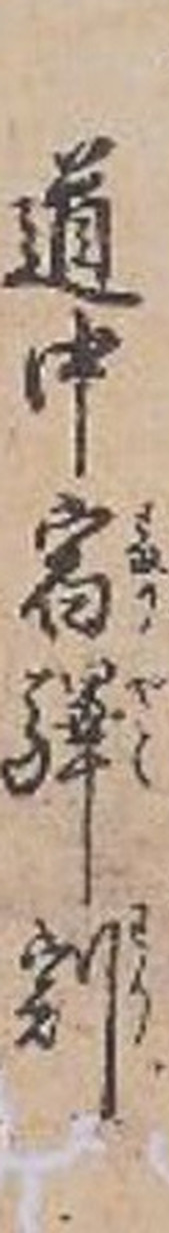道中宿驛割
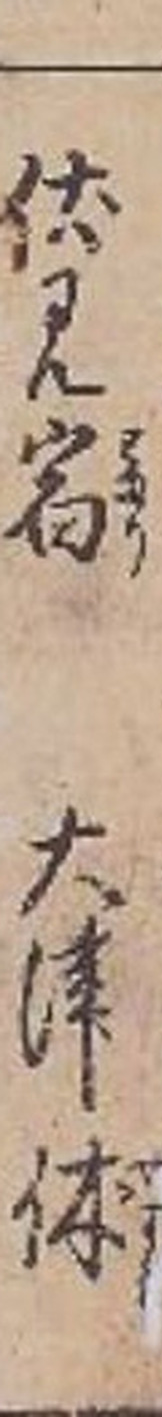伏見宿大津休
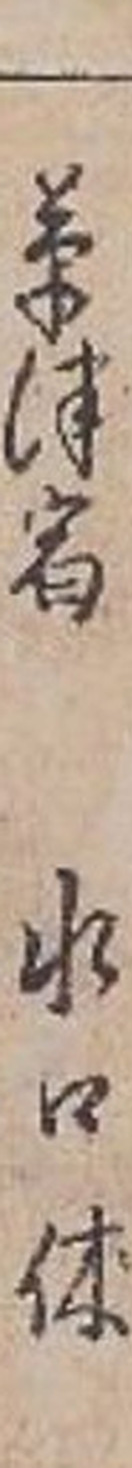草津宿水口休
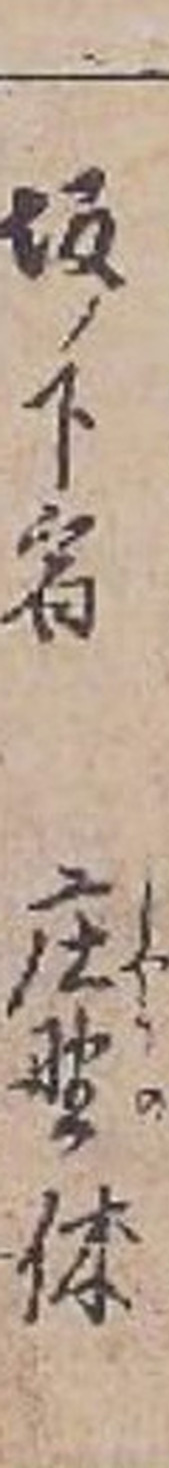坂ノ下宿庄野休

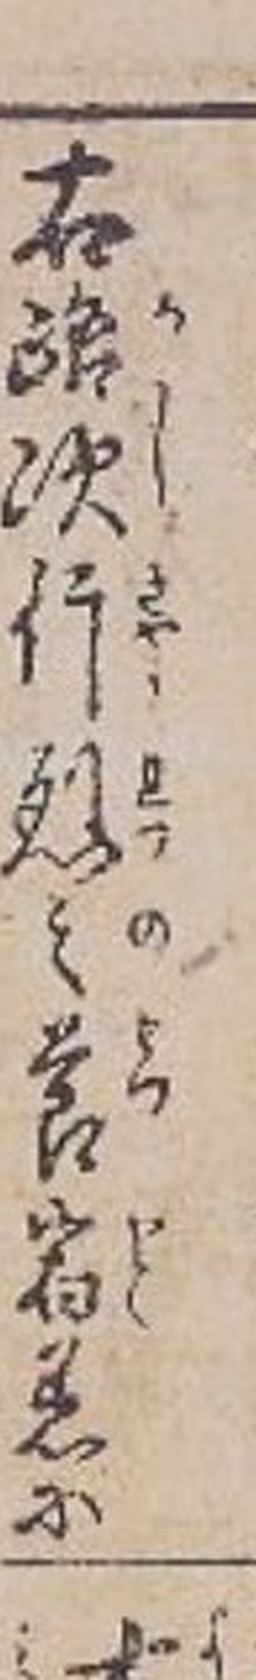右路次行烈の節宿着に
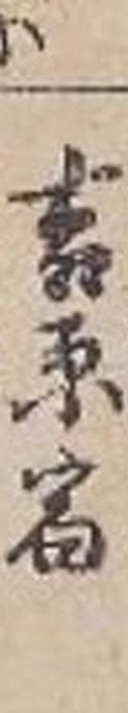吉原宿
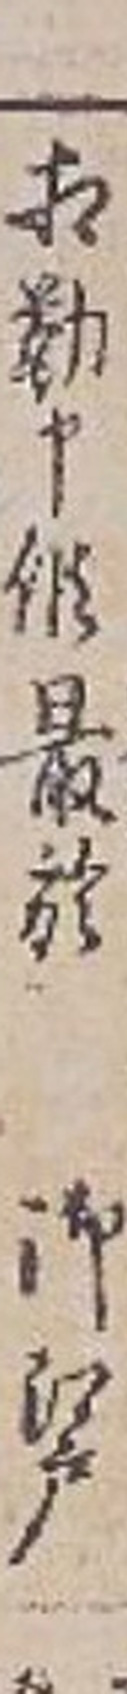相勤申但最於御江戸
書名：琉球人大行列記 来朝新板絵入
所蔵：University of the Ryukyus Library
